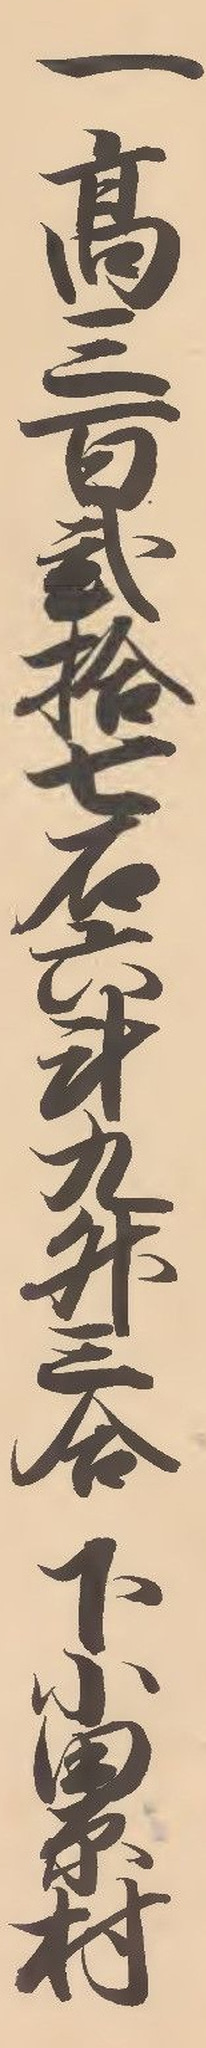一高三百弐拾七石六斗九升三合下小田原村
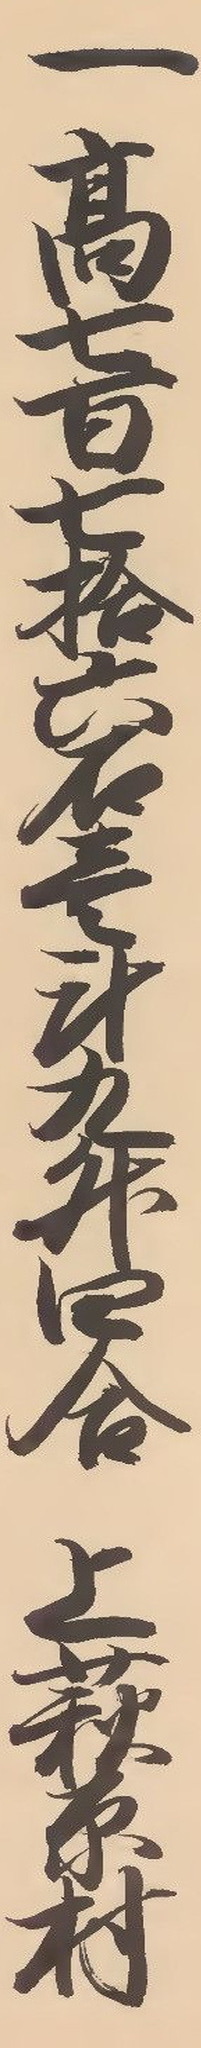一高七百七拾六石壱斗九升四合上萩原村
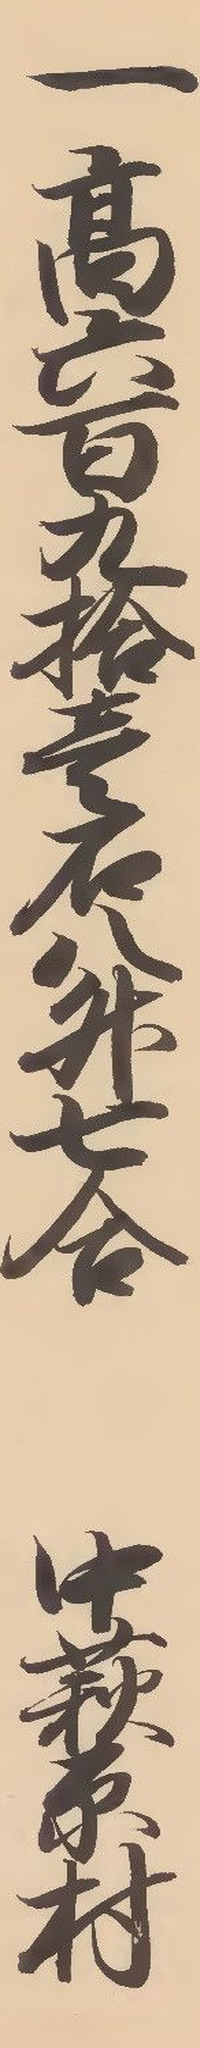一高六百九拾壱石八升七合中萩原村
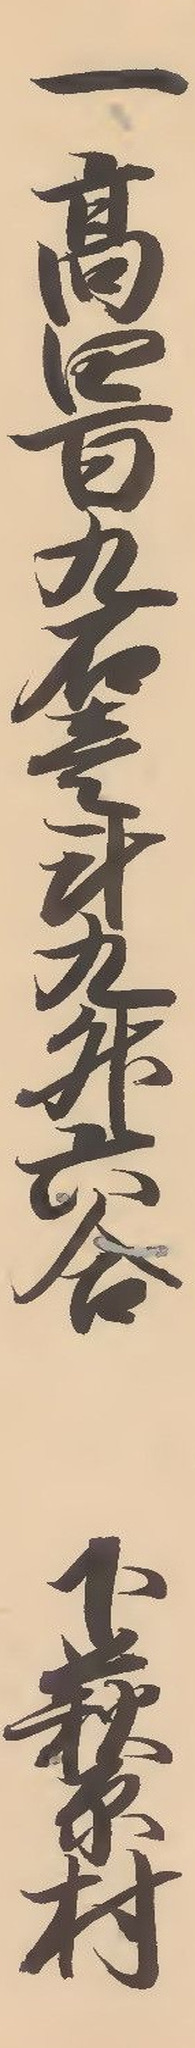一高四百九石壱斗九升六合下萩原村

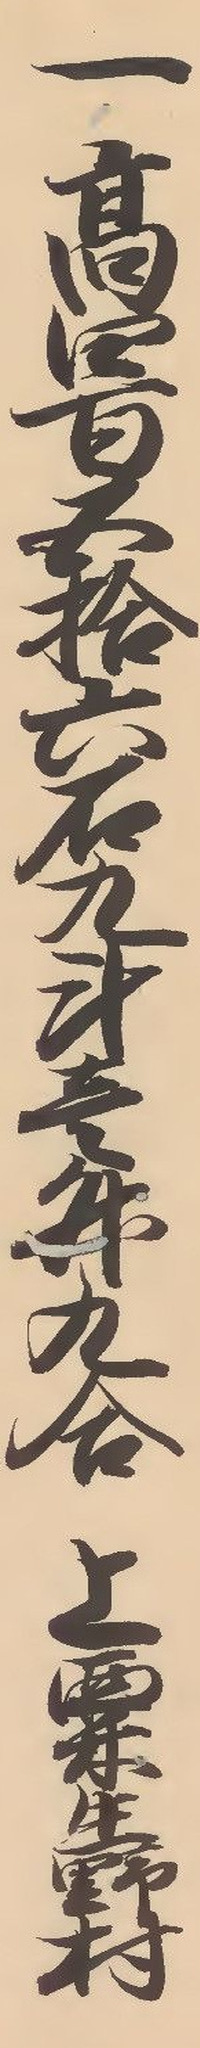一高四百五拾六石九斗壱升九合上粟生野村
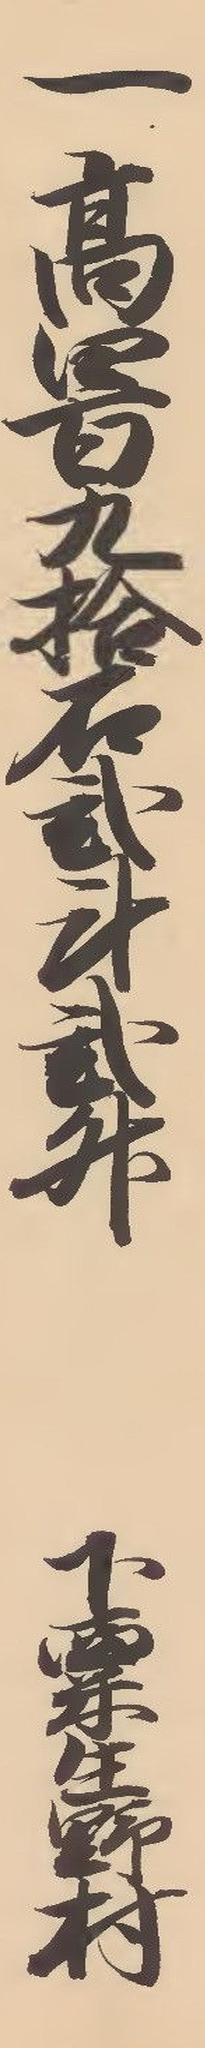一高四百九拾石弐斗弐升下粟生野村
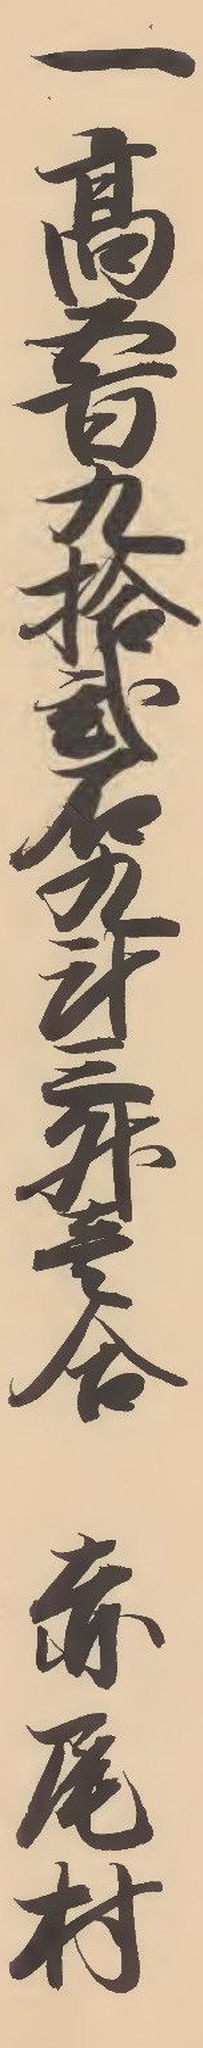一高五百九拾弐石九斗三升壱合赤尾村
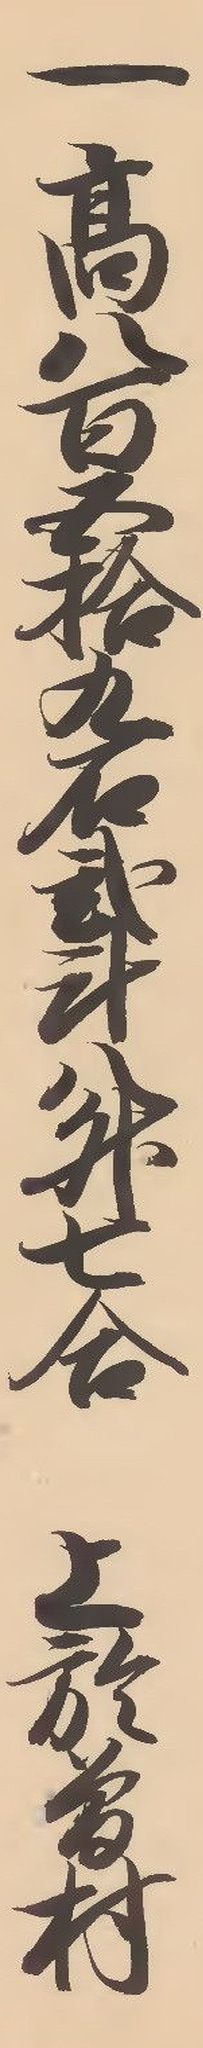一高八百五拾九石弐斗八升七合上於曽村
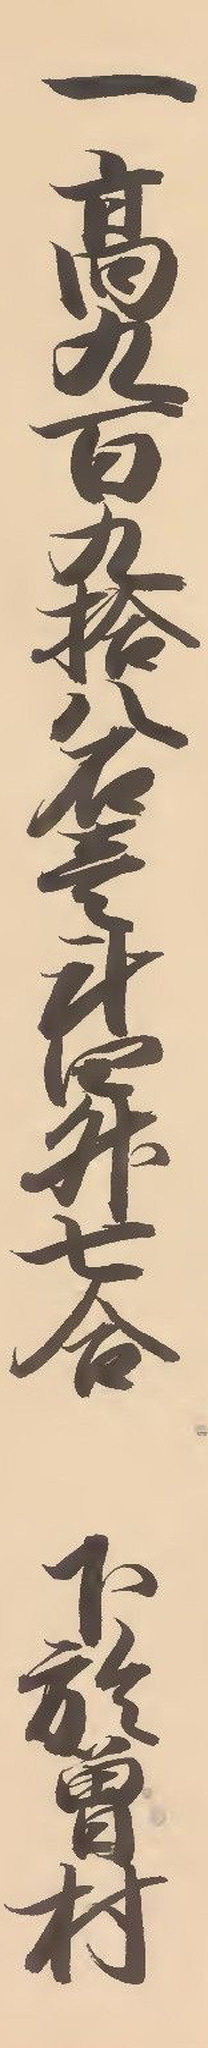一高九百九拾八石壱斗四升七合下於曽村
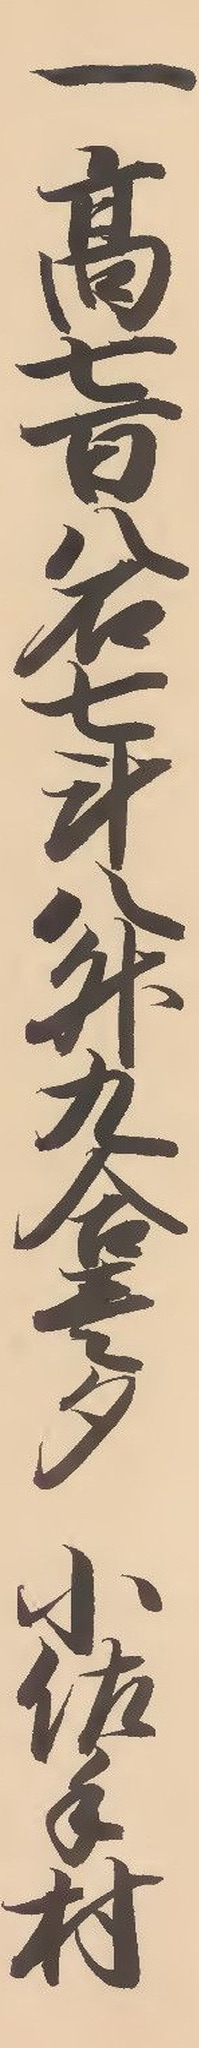一高七百八石七斗八升九合壱勺小佐手村
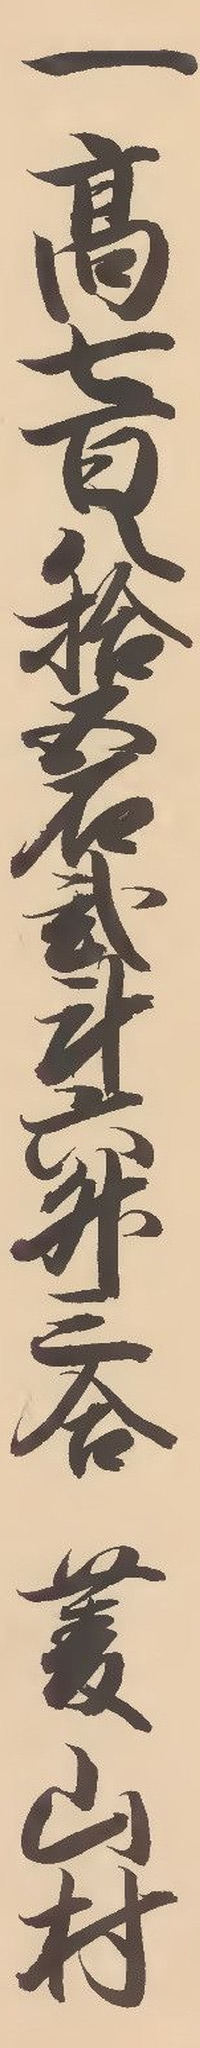一高七百八拾五石弐斗六升三合菱山村
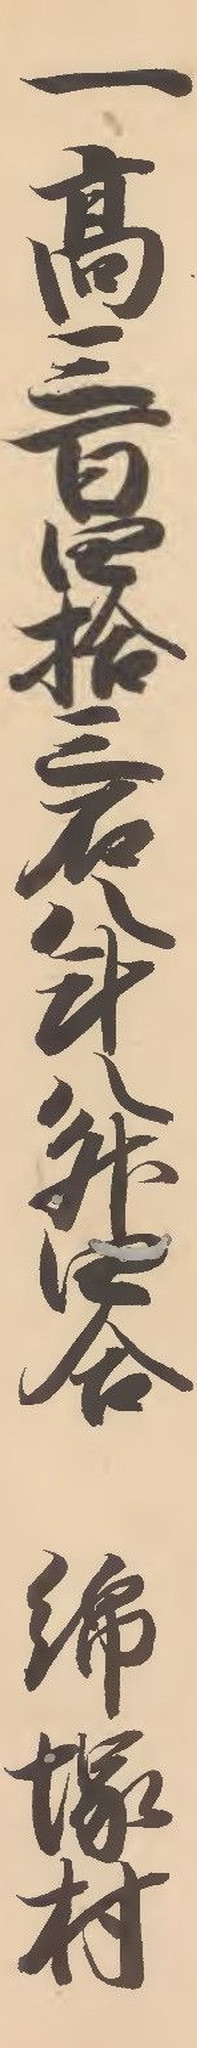一高三百四拾三石八斗八升四合綿塚村

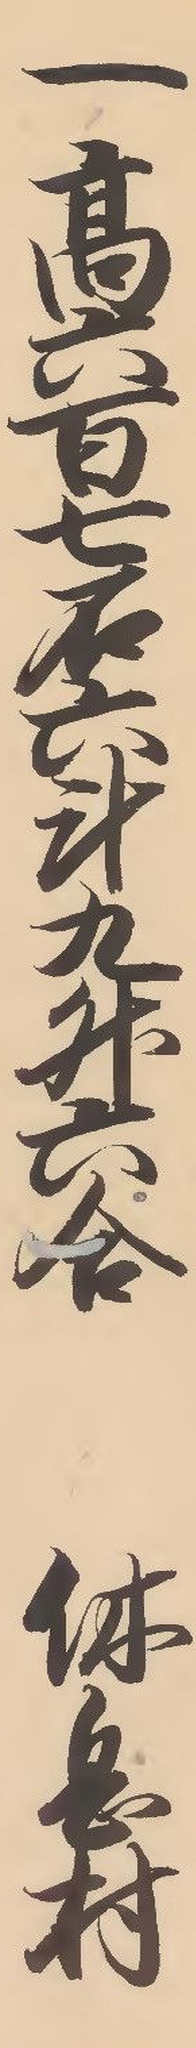一高六百七石六斗九升六合休息村
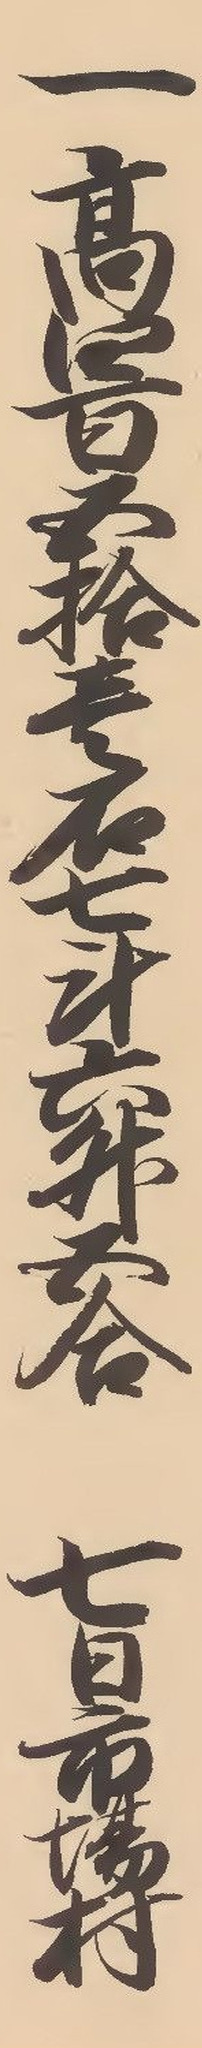一高四百五拾壱石七斗六升五合七日市場村
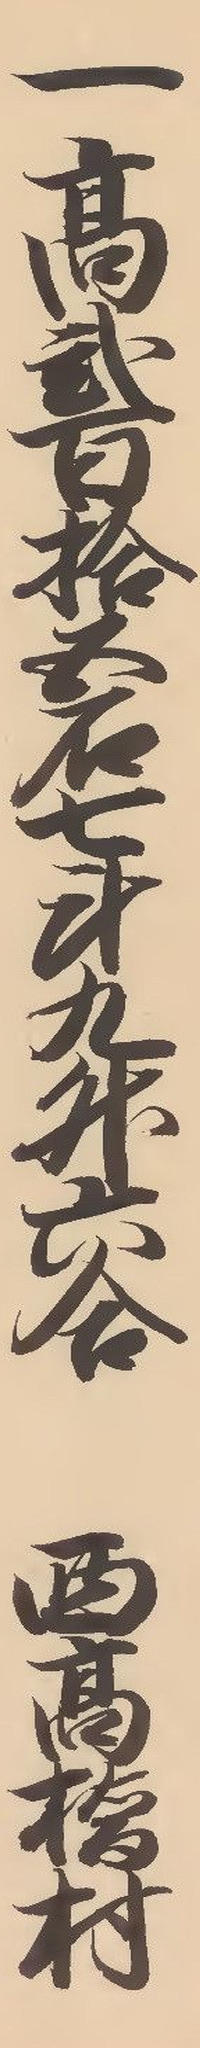一高弐百拾五石七斗九升六合西高橋村
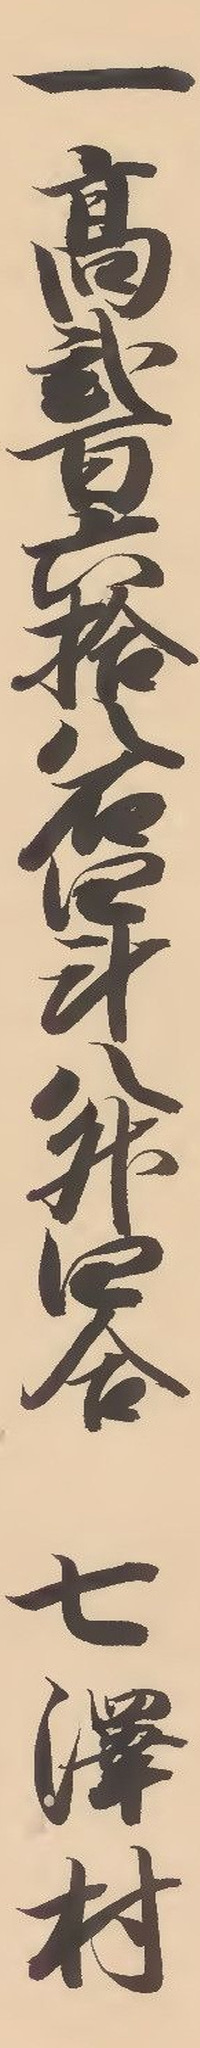一高弐百六拾八石四斗八升四合七沢村
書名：甲斐国郷帳
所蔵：国立公文書館 National Archives of Japan
